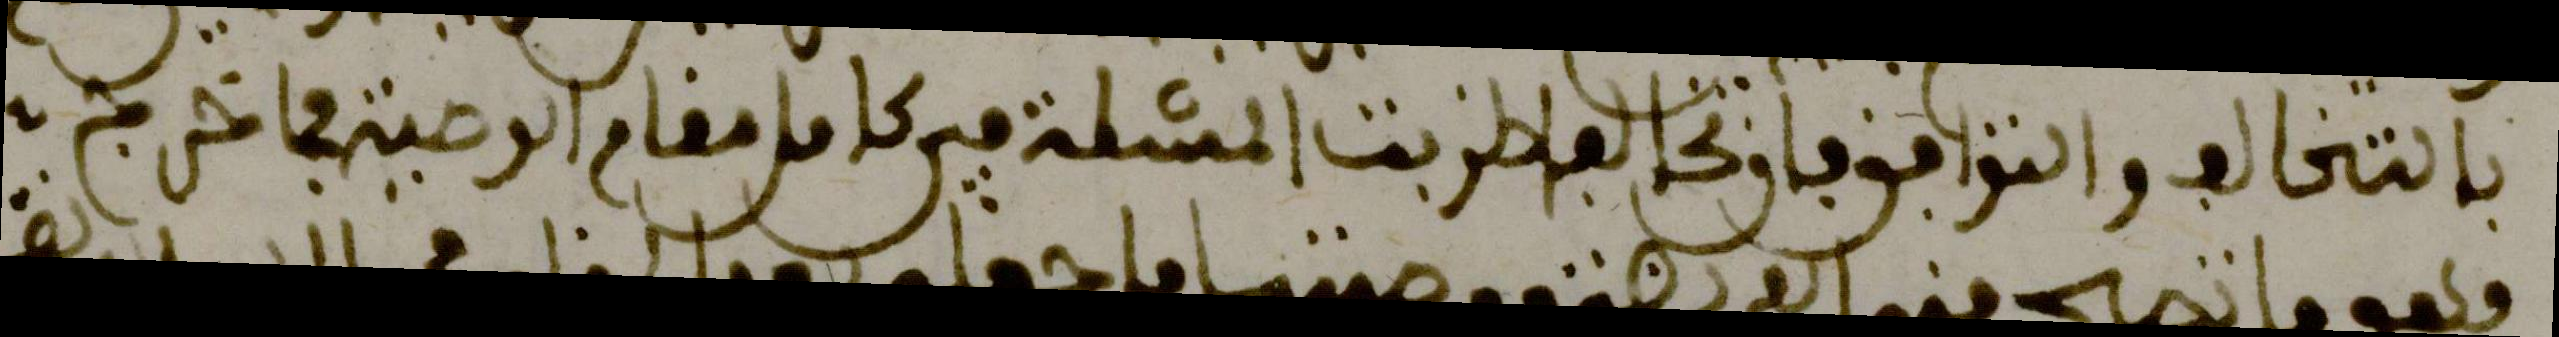بالتخالف والتوافق فان تخالفا ظربت المسئلة في كامل مقام الوصية فما خرج
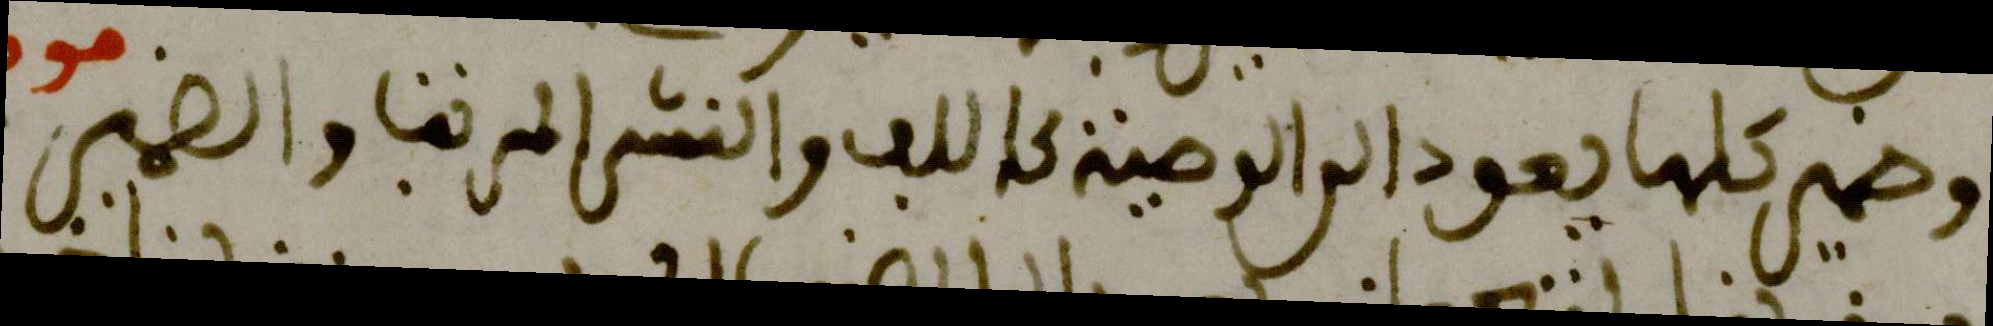وضمير كلها يعود الى الوصية كاللف والنشر والمرتف والضمير
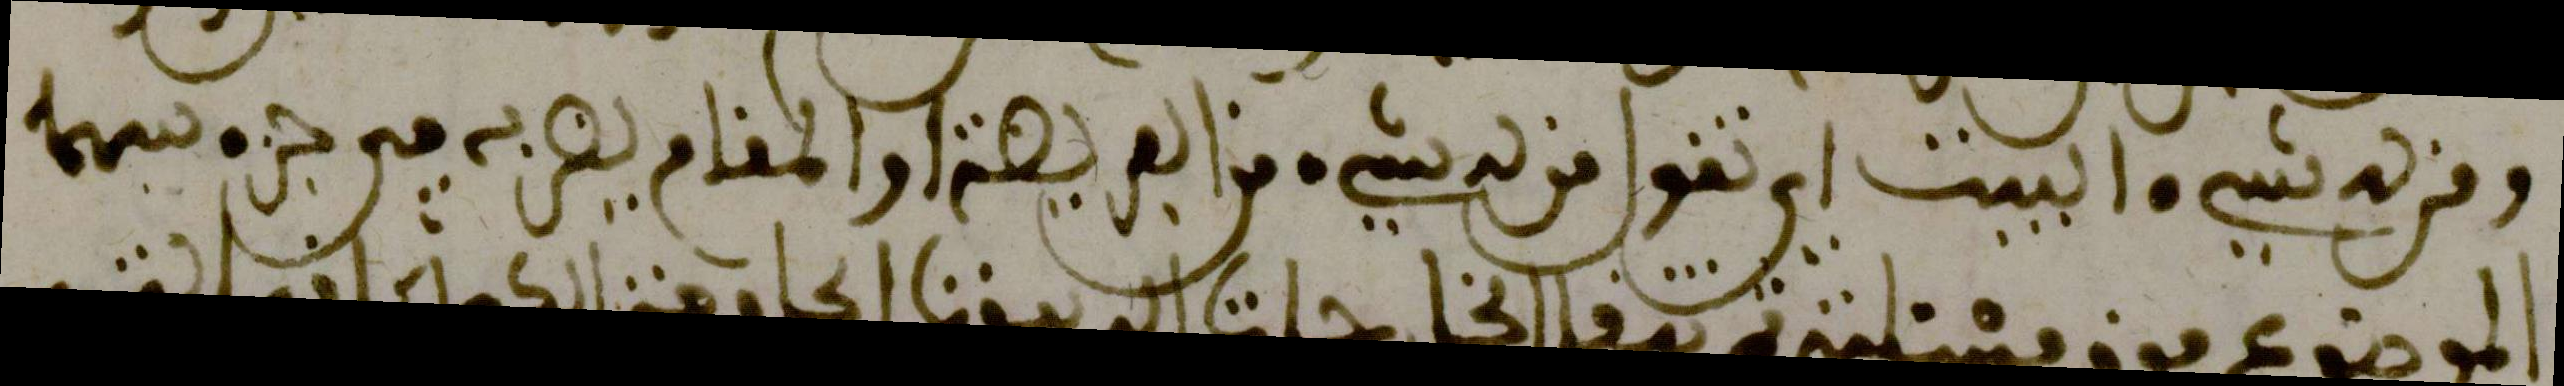ومن له شيء البيت اي تقول نت له شيء من الفريضة او المقام يضربه في جزء سهمه
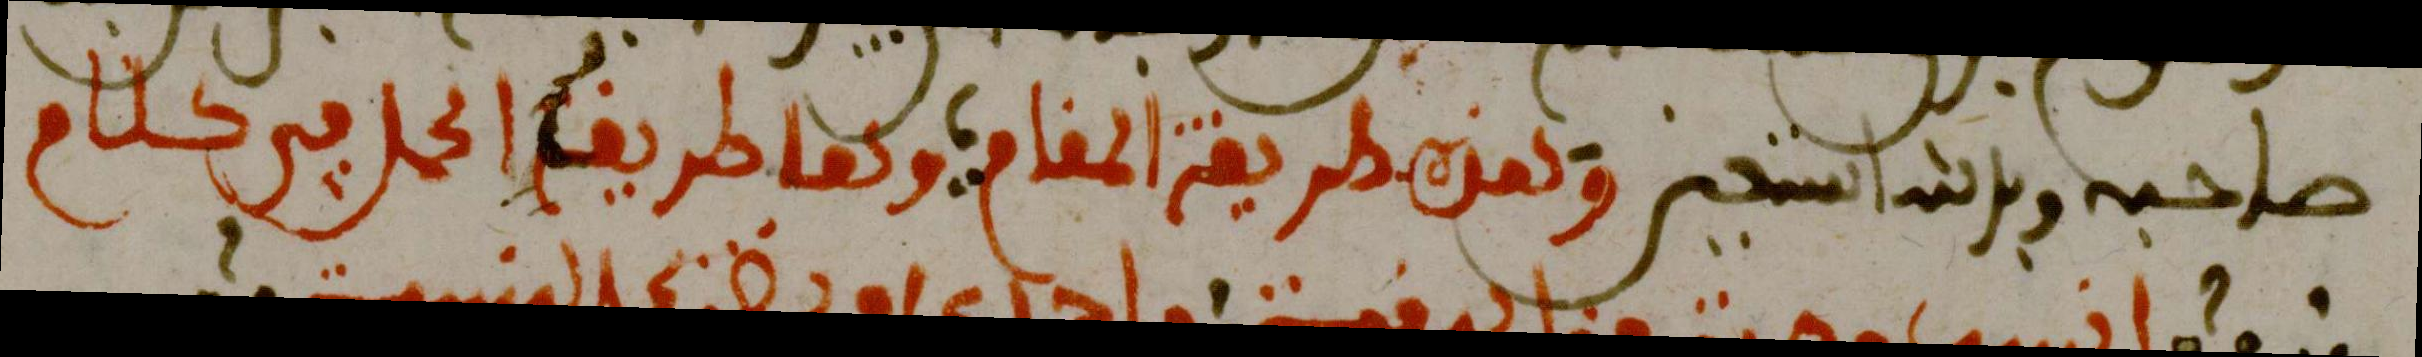صاحبه وبالله استعين وهذه طريقة المقام وها طريقا الحمل في كلام
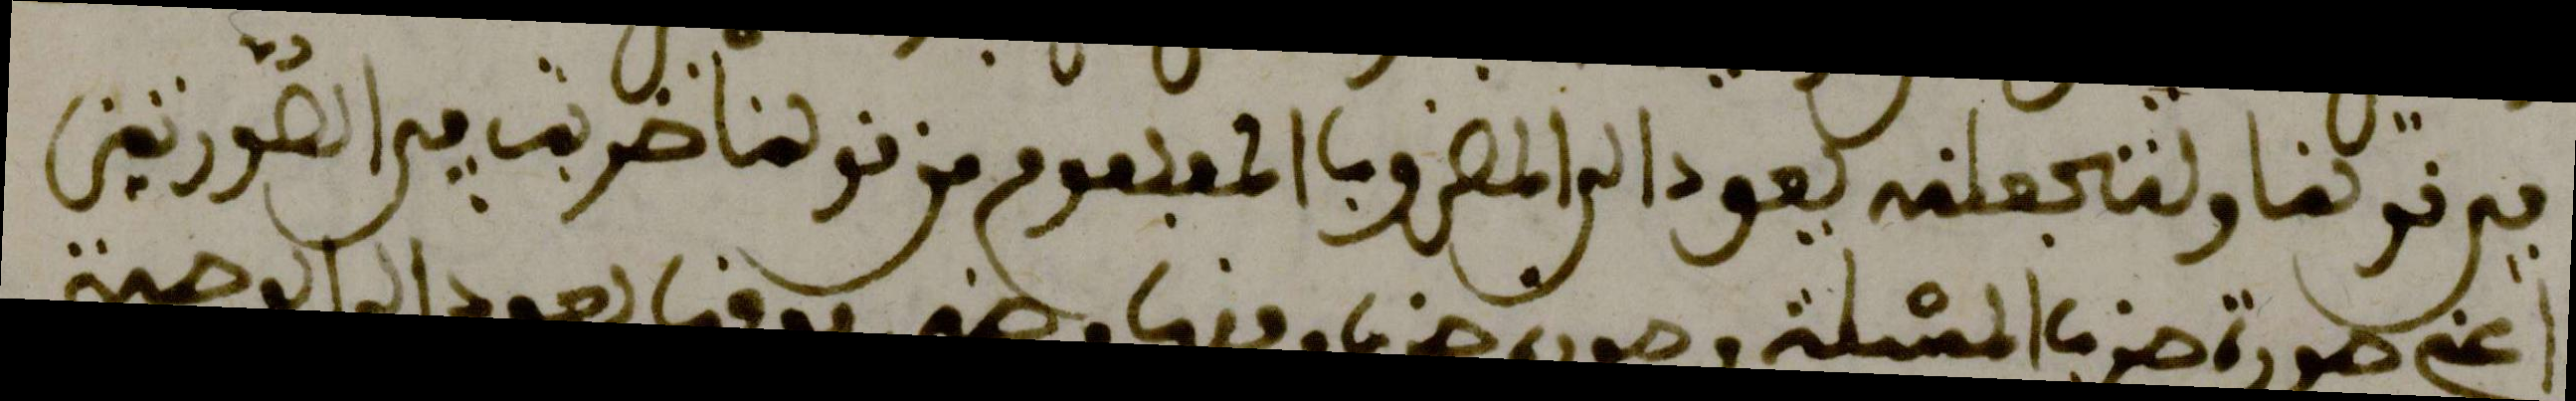في قولنا ولتحجعلنه يعود الى المضروب المفهوم من قولنا ضربت في الصورتين
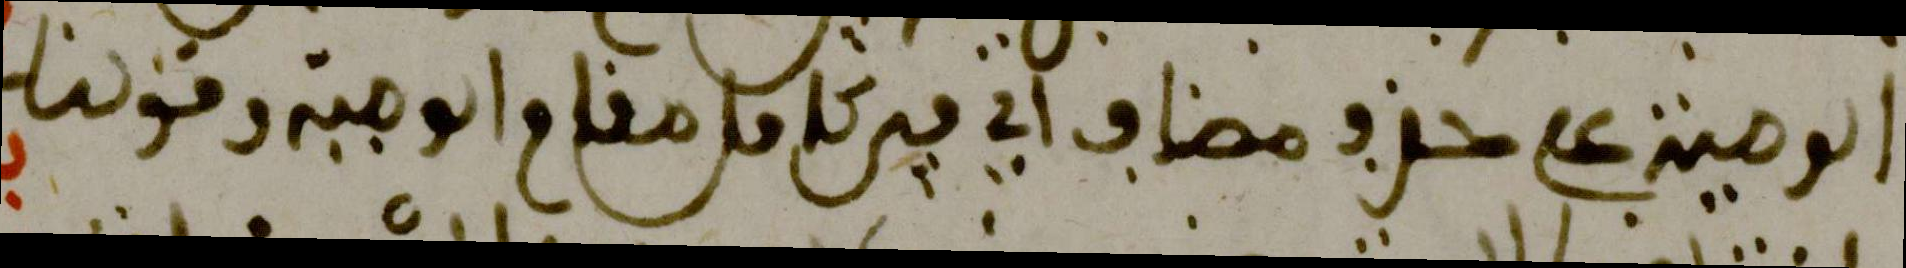الوصية على حذف مضاف اي في كامل مقام الوصية وقولنا
